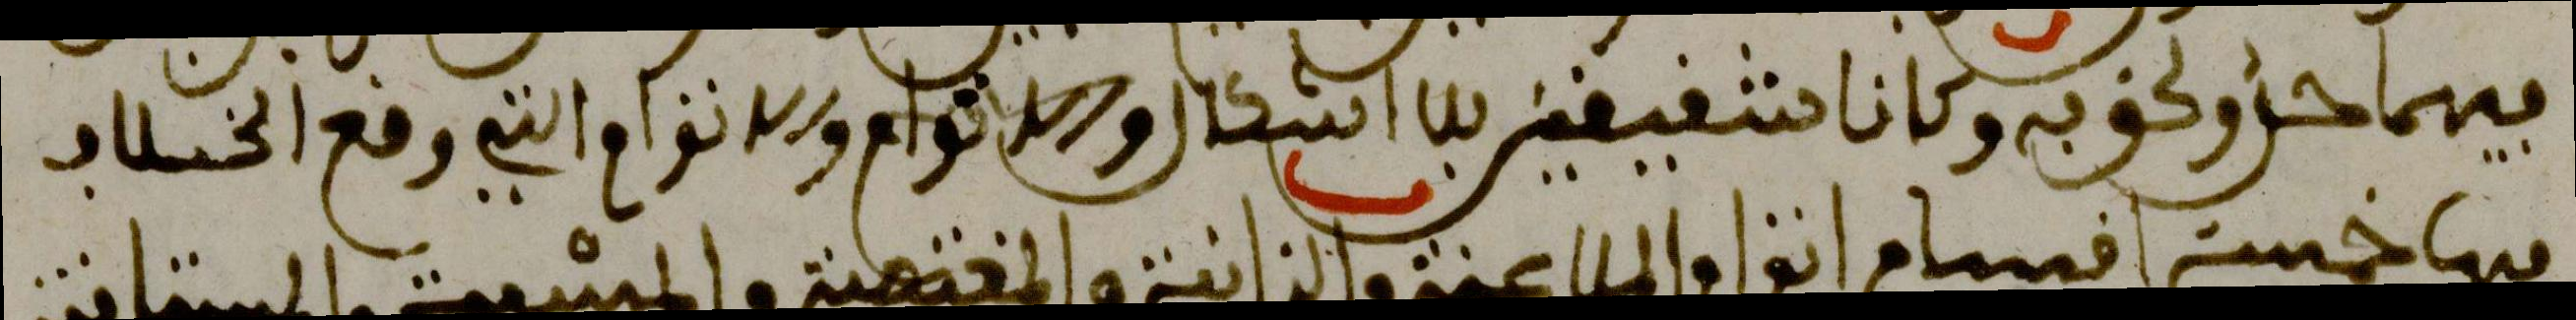فيهما حدو لحق به و كانا شقيقين بلا اشكال ف و الانواع و الانواع التي وقع الخلاف
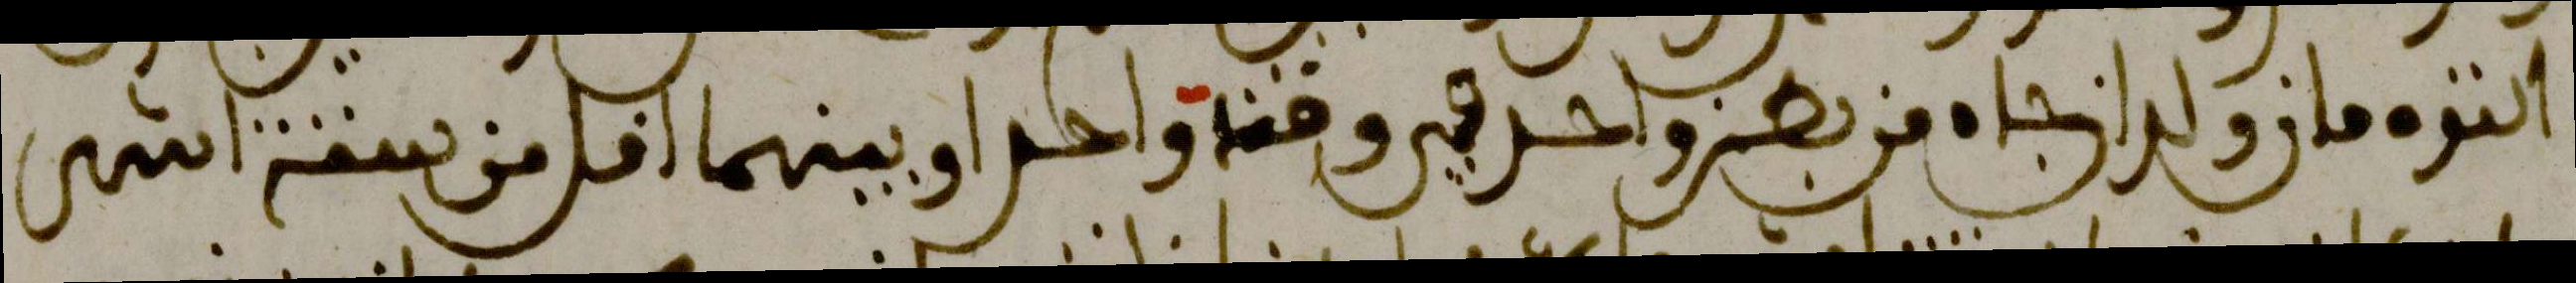التوءمان ولدان جاء من بطن واحد في وقت واحد او بينهما اقل من ستة اشهر
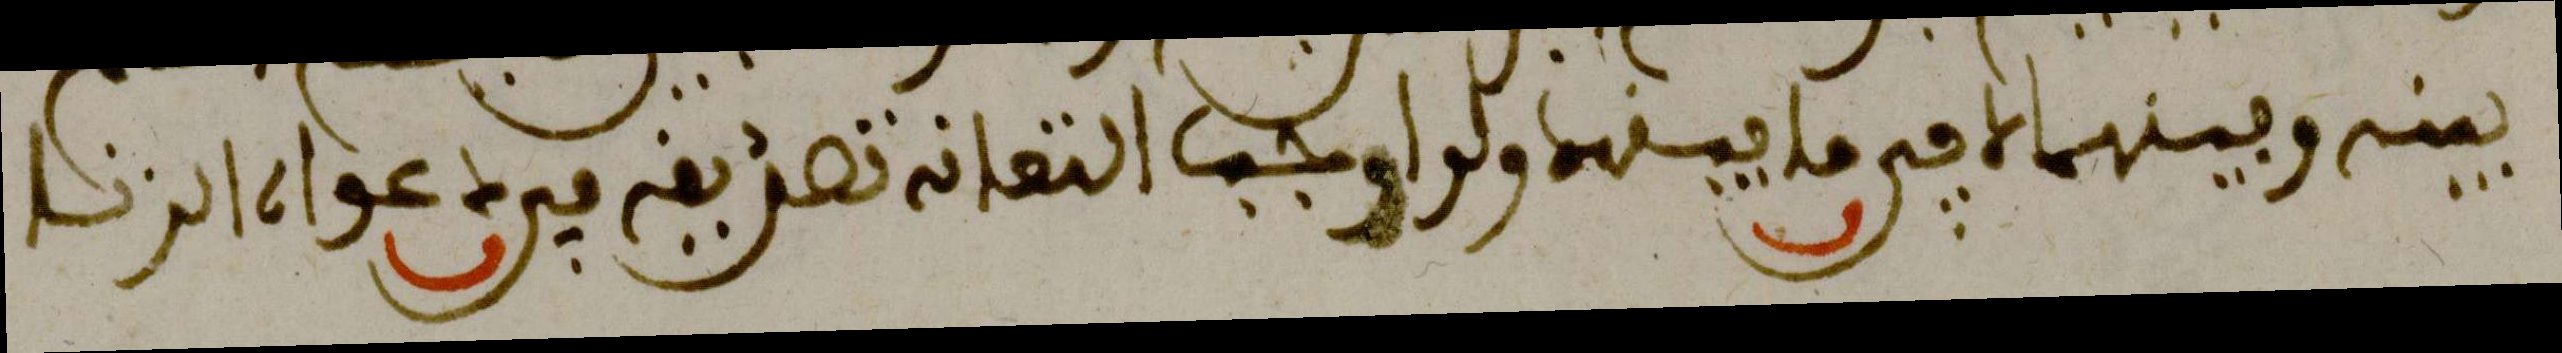بينه و بينهما لا في ما بينهما و لو اوجب التعانه تصديقه في دعواه الزنا
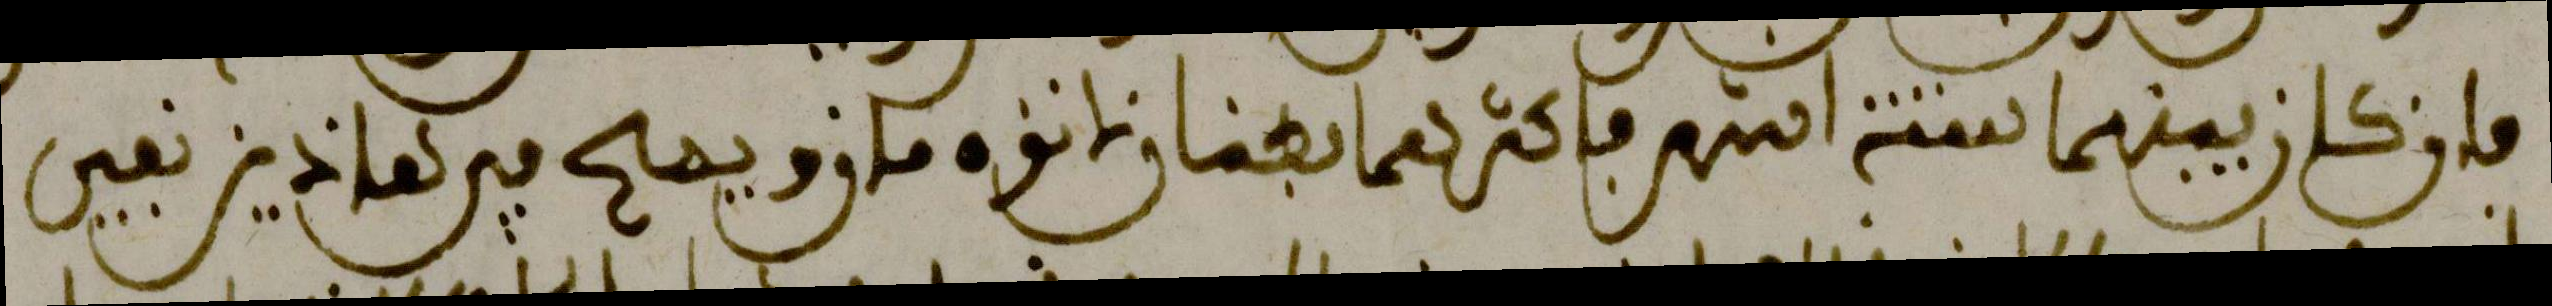فان كان بينهما ستة اشهر فاكثرهما بط بطنان لا توءمان و يصح في هاذين نفي
